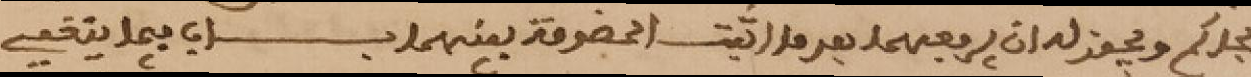بحاكم ويجوز له ان يرفعهما بعدما اثبت الخصومة بينهما باب فيما ينبغي
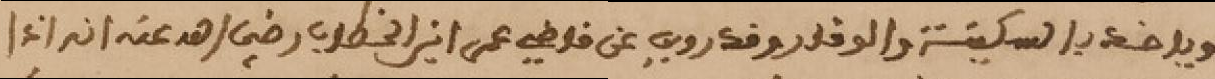وياخذ بالسكينة والوقار وقد روي عن قاضي عمر ابن الخطاب رضي الله عنه انه اذا
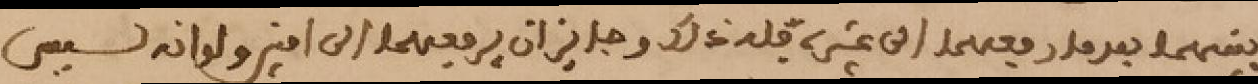بينهما بعدما رفعهما الى غيره فله ذلك وجايز ان يرفعهما الى امين ولو انه ليس
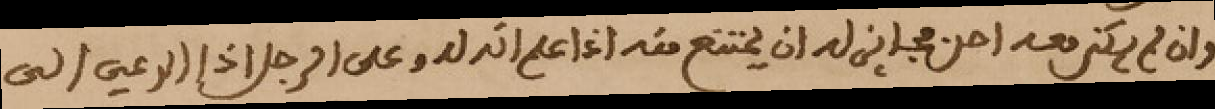وان لم يكن معه احد فجايز له ان يمتنع منه اذا علم انه له وعلى الرجل اذا ادعي الى
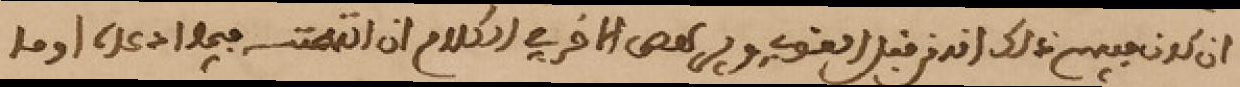ان كان فيهم ذلك انه من قبل القوي و# الاخر في الكلام ان # فيما ادعاه او ما
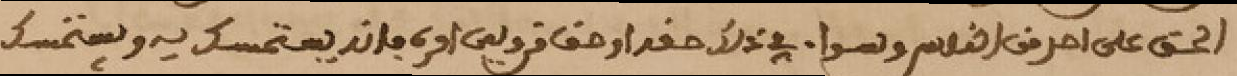الحق على احد من الناس وسواء في ذلك حقد او حق من ولي امره فانه يستمسك به ويستمسك
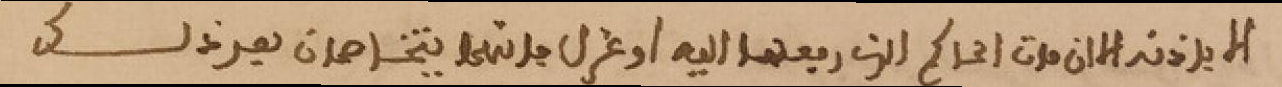الا باذنه الا ان مات الحاكم الذي رفعها اليه او عزل فانهما يتخاصمان بعد ذلك
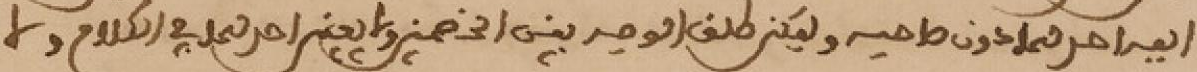اليه احدهما دون صاحبه وليكن طلق الوجه بين الخصمين ولا يعين احدهما في الكلام ولا
